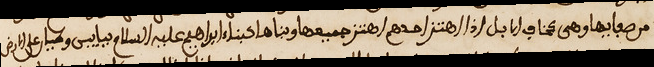من صفايها وهى كخاف الابل اذا اهتز احدهم اهتز جميعها وبناها كبناء ابراهيم عليه السلام بيابين وطيان على الارض
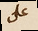على
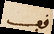قف
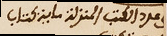ى عدد الكتب المنزلة ماية كتاب
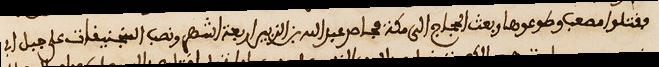فقتلوا مصعب وطوعوها وبعث الحجاج الى مكة فحاصر عبد الله بن الزبير اربعة اشهر ونصف المنجنيقات على جبل ابى
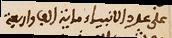على عدد الانبياء ماية الف واربعة
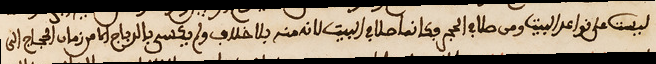ليست على قواعد البيت ومن صلا في الحجر فكانما صلا في البيت لانه منه بلا خلاف ولم يكسى بالدباج الامن زمان الحجاج الى
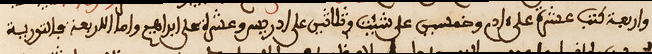واربعة كتب عشرة على ءادم وخمسين على شئت وثلاثين على ادريس وعشرة على ابراهيم واما الاربعة فالتورية
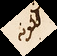لكونه
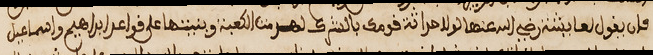فان يقول لعايشة رضي الله عنها لو لا حداثة قومك بالشرك لهدمت الكعبة وبنيتها على قواعد ابراهيم واسماعيل
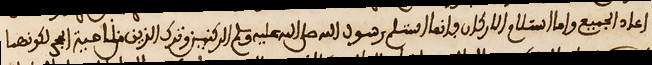اعاد الجميع واما استلام الاركان فانما استلم رسول الله صلى الله عليه وسلم الركنين وترك الزين من ناحية الحجر لكونهما
